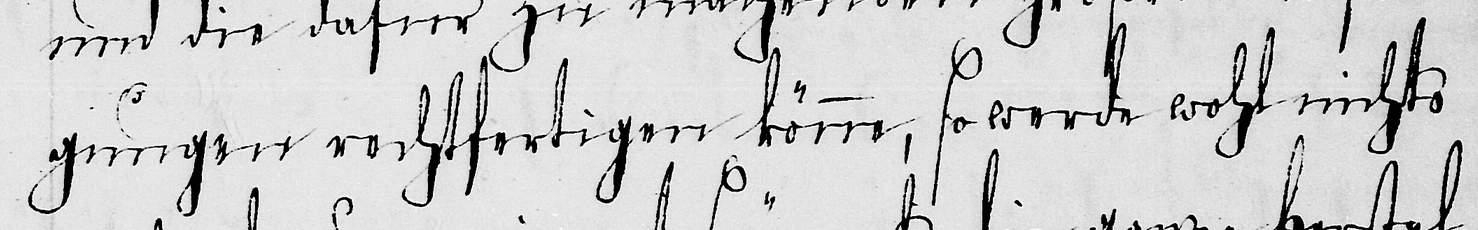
gungen rechtfertigen könne, so werde wohl nichts
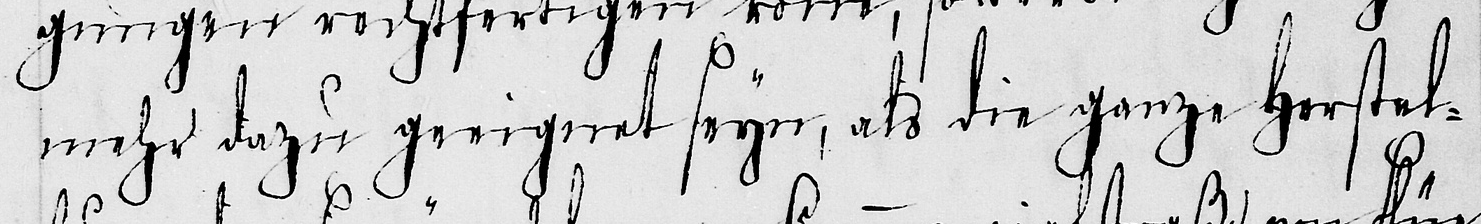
mehr dazu geeignet seyn, als die ganze Herstel¬
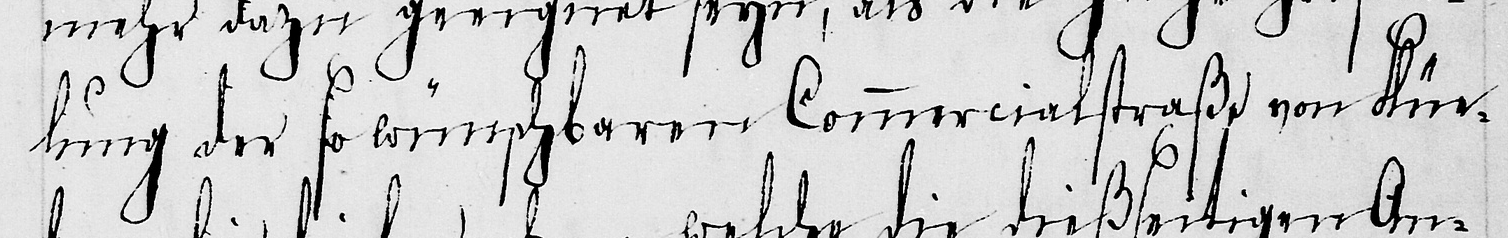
lung der so wünschbaren Commercialstraße von Flüe¬
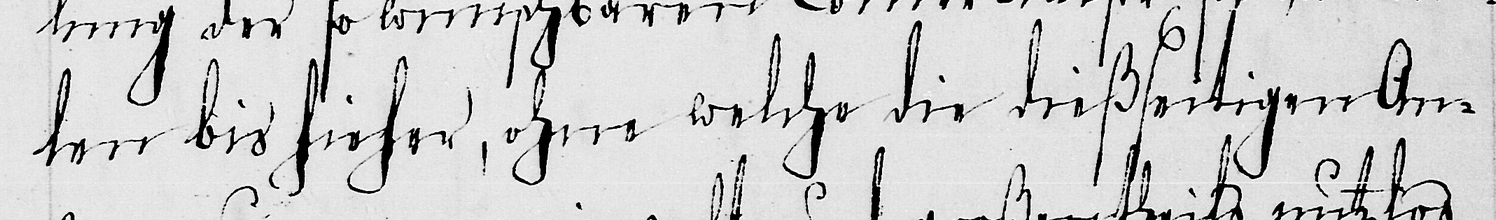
len bis hieher, ohne welche die dießseitigen An¬
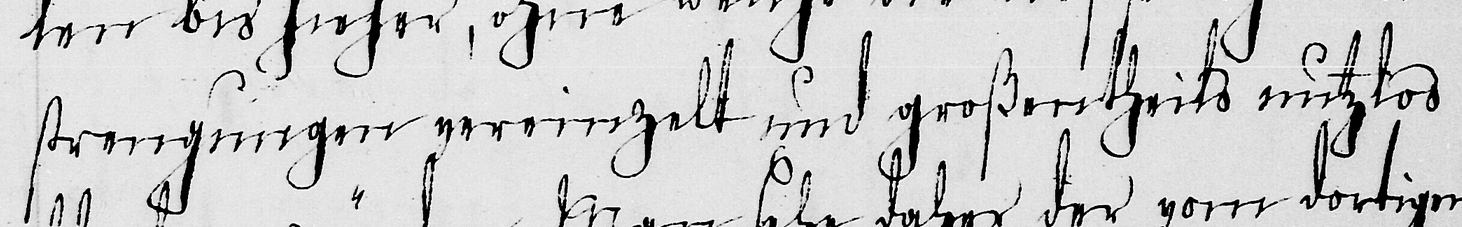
strengungen vereinzelt und großentheils nutzlos
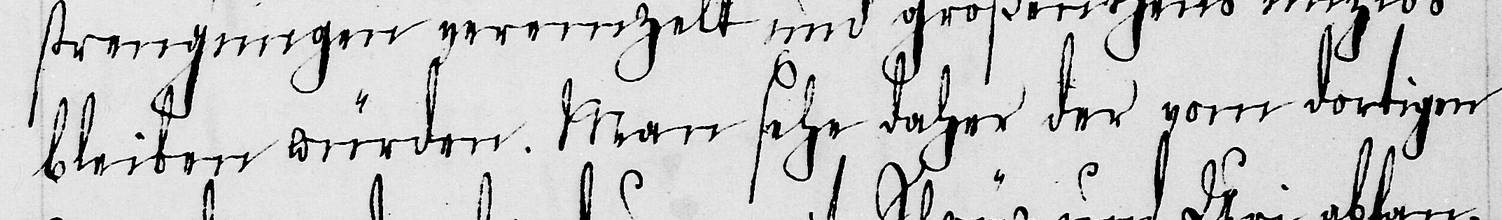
bleiben würden. Man sehe daher der vom dortigen
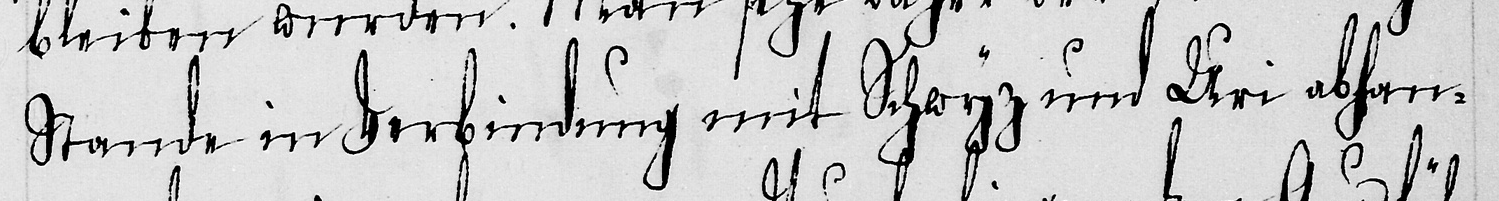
Stande in Verbindung mit Schwyz und Uri abhan¬
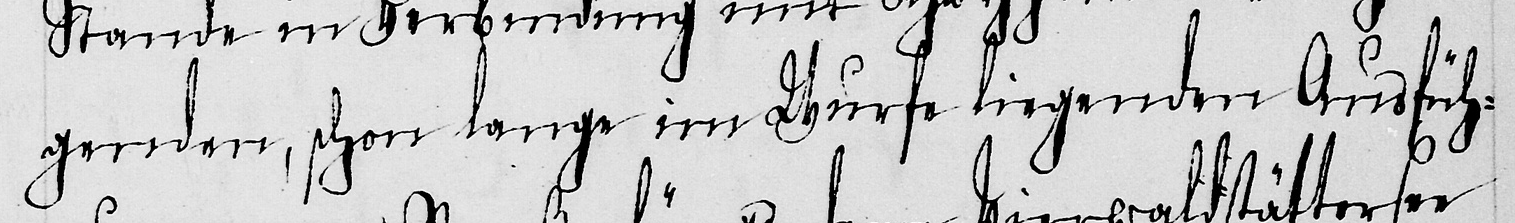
genden, schon lange im Wurfe liegenden Ausfüh¬
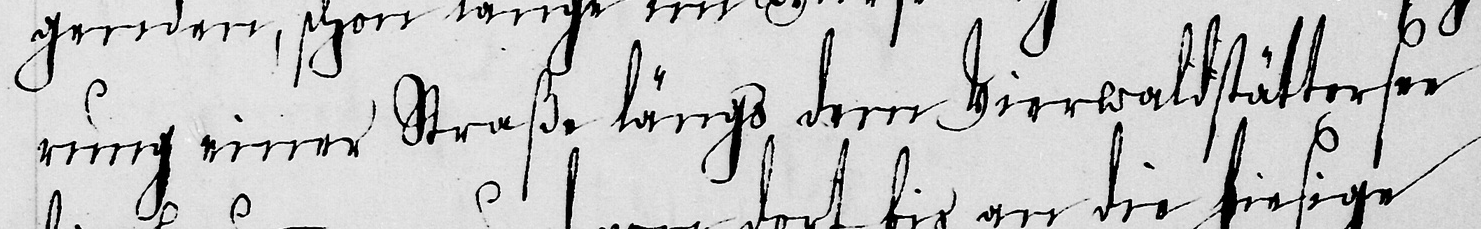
rung einer Straße längs dem Vierwaldstättersee
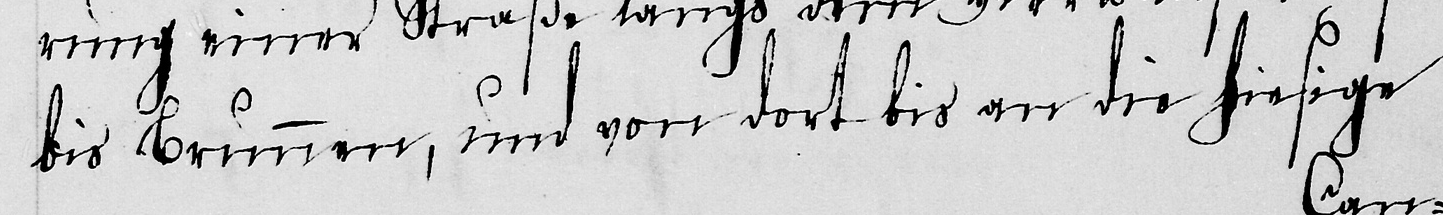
bis Brunnen, und von dort bis an die hiesige
